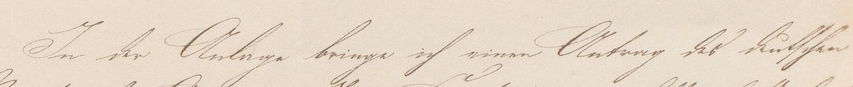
In der Anlage bringe ich einen Antrag des deutschen
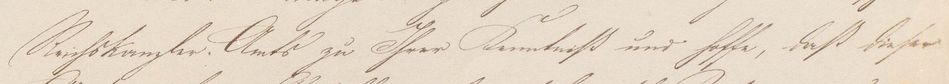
Reichskanzler-Amts zu Ihrer Kenntniß und hoffe, daß dieser
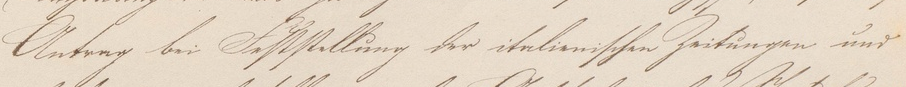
Antrag bei Feststellung der italienischen Zeitungen und
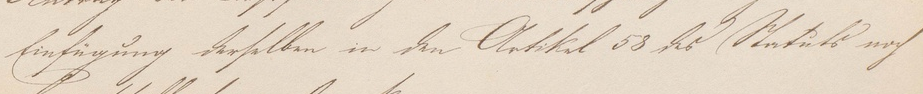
Einfügung derselben in den Artikel 58 des Statuts noch
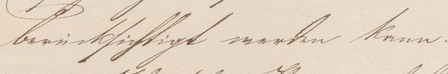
berücksitigt werden kann.
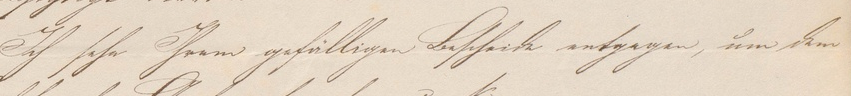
Ich sehe Ihrem gefälligen Bescheide entgegen, um dem
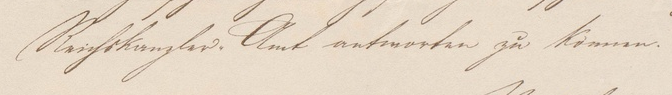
Reichskanzler-Amt antworten zu können.
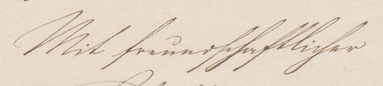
Mit freundschaftlicher
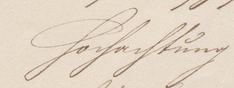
Hochachtung
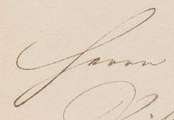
Herrn
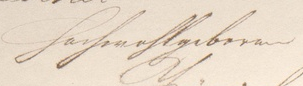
Hochwohlgeboren
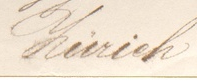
Zürich
